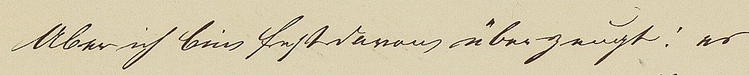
Aber ich bin fest davon überzeugt: es
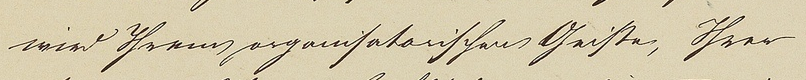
wird Ihrem organisatorischen Geiste, Ihrer
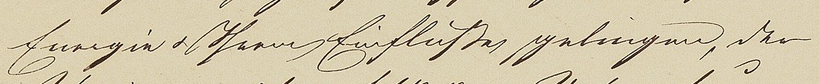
Energie & Ihrem Einfluße gelingen, der
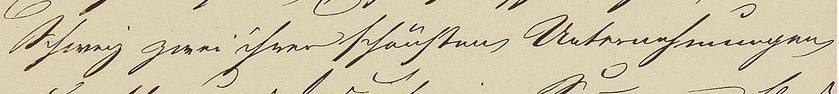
Schweiz zwei ihrer schönsten Unternehmungen
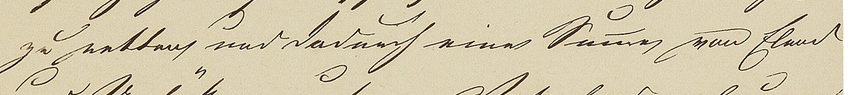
zu retten und dadurch eine Summe von Elend
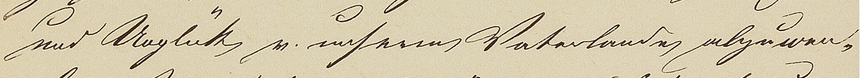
und Unglük v. unserm Vaterlande abzuwen-
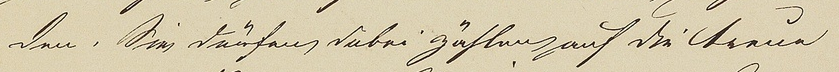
den. Sie dürfen dabei zählen auf die treue
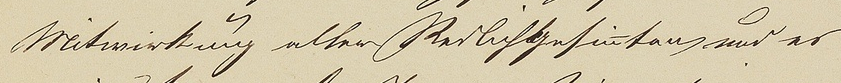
Mitwirkung aller Redlichgesinnten und es
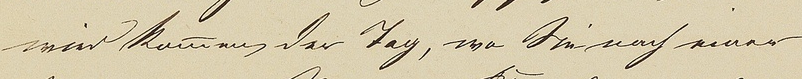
wird kommen der Tag, wo Sie nach einer
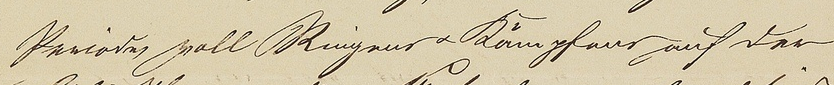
Periode voll Ringens & Kämpfens auf der
